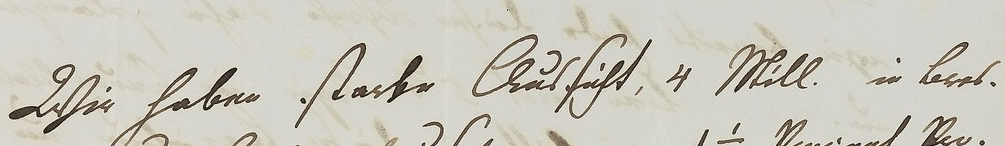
Wir haben starke Aussicht, 4 Mill. in Bres-
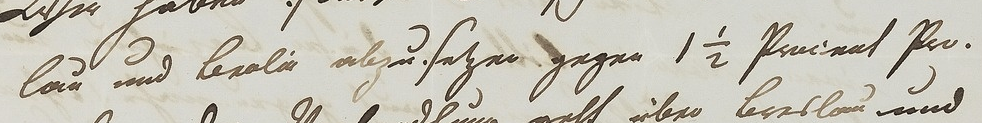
lau und Berlin abzusetzen gegen 1 ½ Procent Pro-
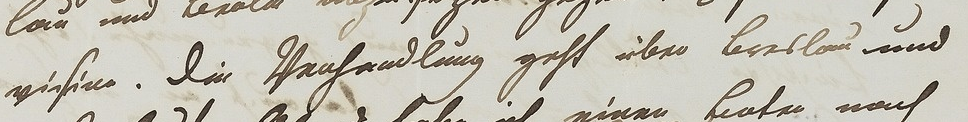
vision. Die Verhandlung geht über Breslau und
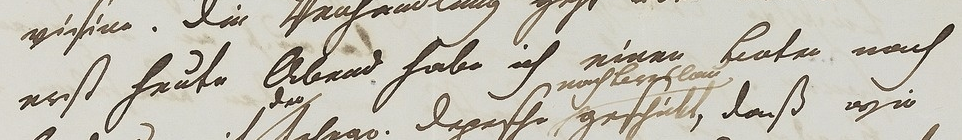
erst heute Abend habe ich einen Boten nach
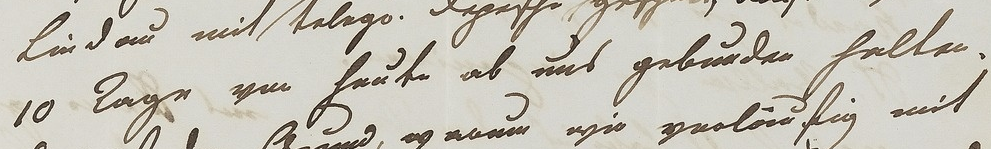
10 Tage von heute ab uns gebunden halten.
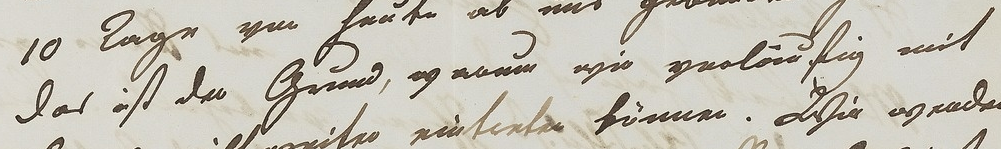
Das ist der Grund, warum wir vorläufig mit
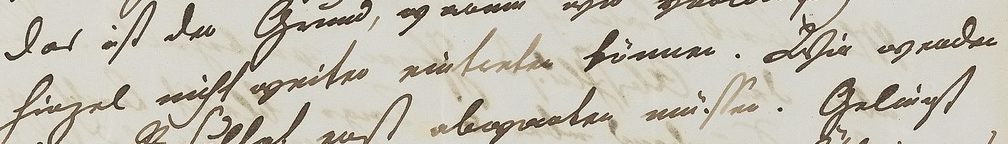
Hirzel nicht weiter eintreten können. Wir werden
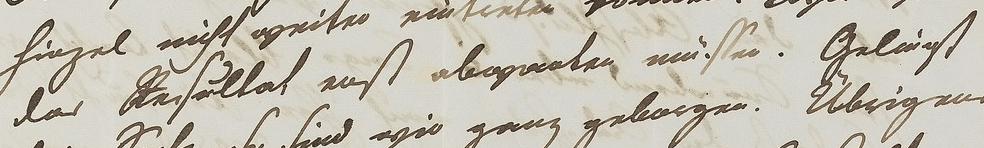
das Resultat erst abwarten müssen. Gelingt
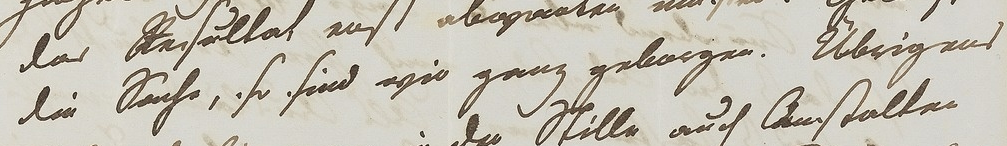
die Sache, so sind wir ganz geborgen. Übrigens
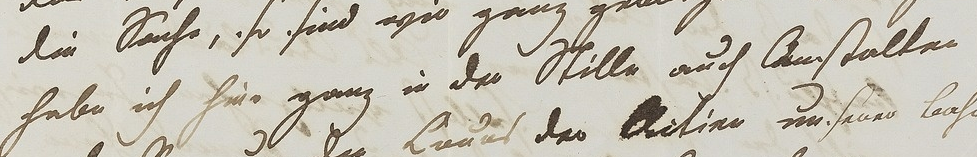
habe ich hier ganz in der Stille auch Anstalten
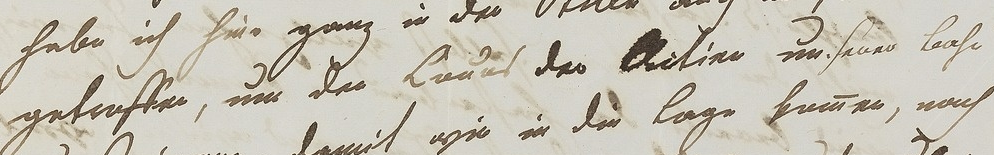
getroffen, um den Cours der Actien unserer Bahn
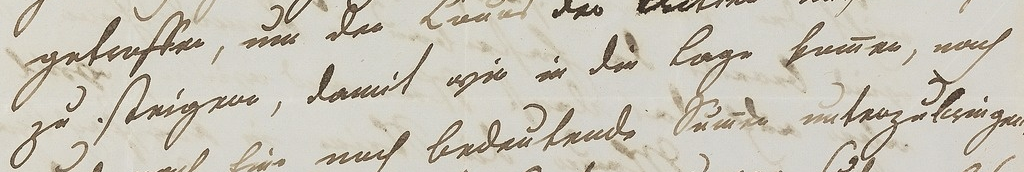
zu steigern, damit wir in die Lage kommen, nach
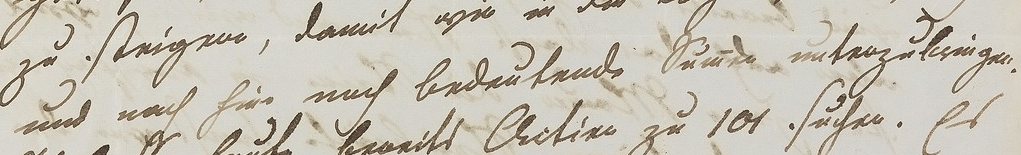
und nach hier noch bedeutende Summen unterzubringen.
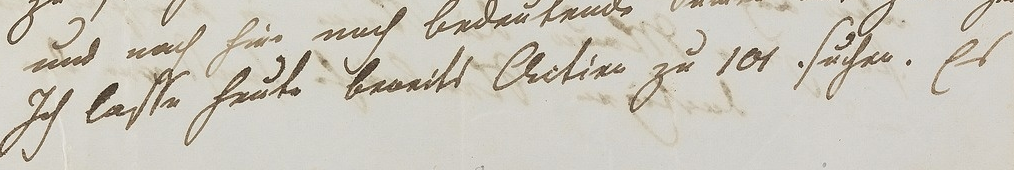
Ich lasse heute bereits Actien zu 101 suchen.
